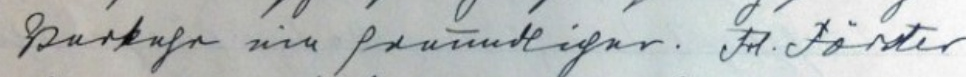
Verkehr nie freundlicher. Frl. Förster
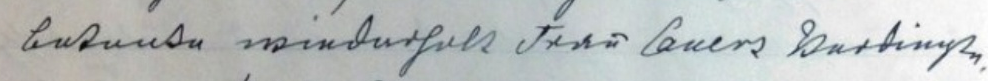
betonte wiederholt Frau Lauers Verdienste.
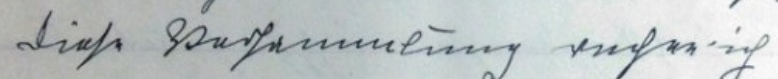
Die Versammlung rechne ich
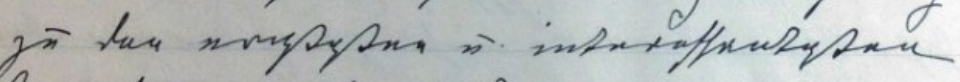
zu den ernstesten u. interessantesten
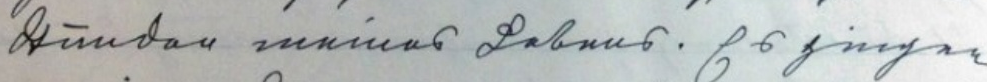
Stunden meines Lebens. Es gingen
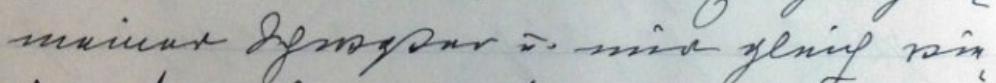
meiner Schwester u. mir gleich vie
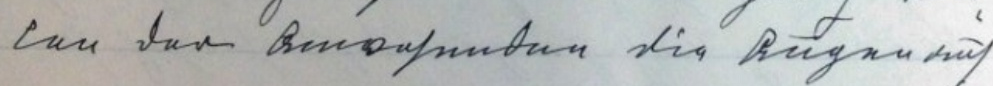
len der Anwesenden die Augen auf.
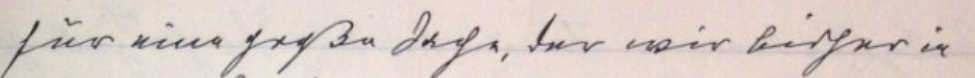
für eine große Sache, der wir bisher in
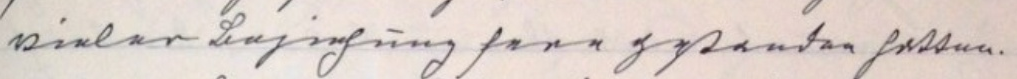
vieler Beziehung fern gestanden hatten.
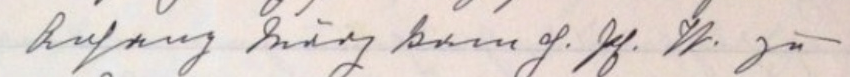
Anfang März kam H. Pf. W. zu
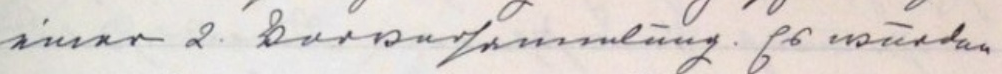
zu einer 2. Vorversammlung. Es wurden
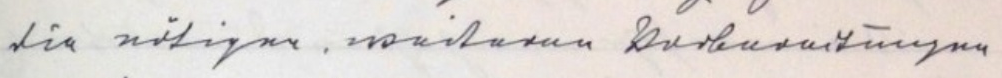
die nötigen weiteren Vorbereitungen
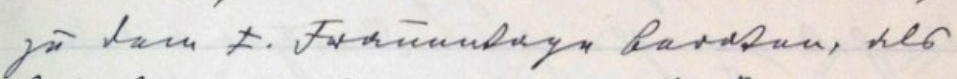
zu dem I. Frauentage beraten, als
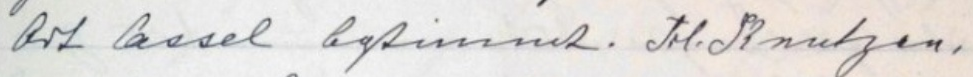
Ort Cassel bestimmt. Frl. Knutzen,
